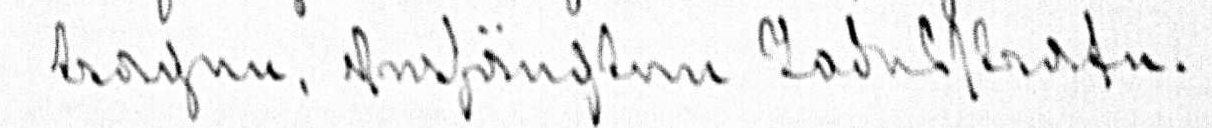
tragen, Verhängten Todesstrafe.
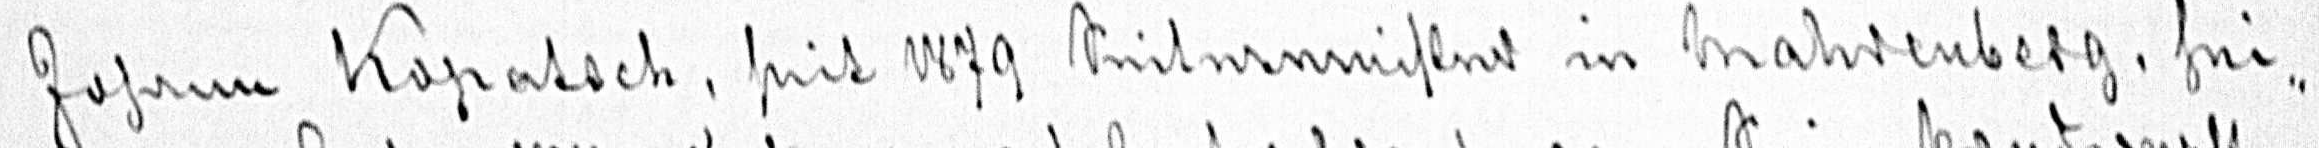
Johann Kopatsch, seit 1879 Seilermeister in Mahrenberg, hei¬
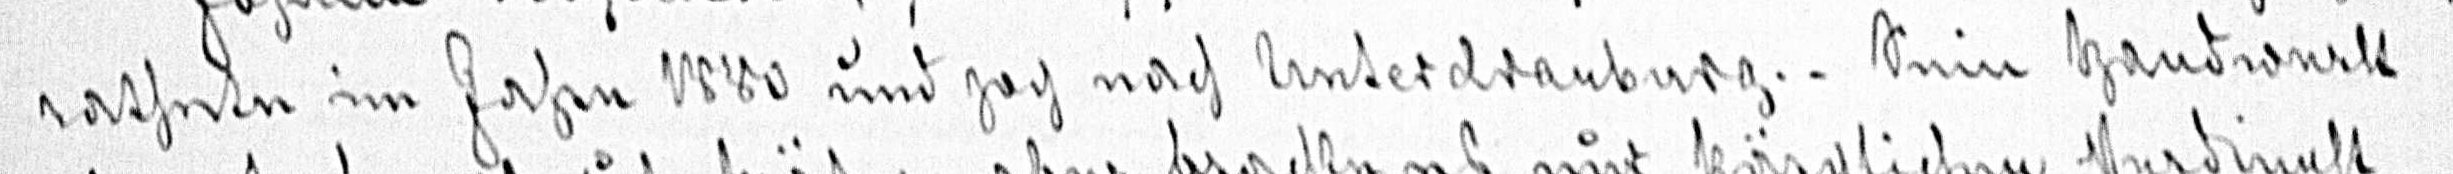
rathete im Jahre 1880 und zog nach Unterdrauburg. Sein Handwerk
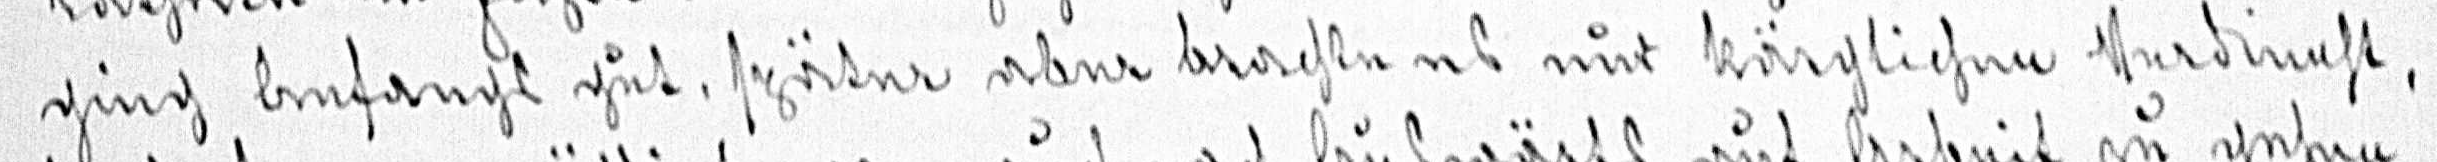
ging Anfangs gut, später aber brachte es nur kärgliche Verdienst,
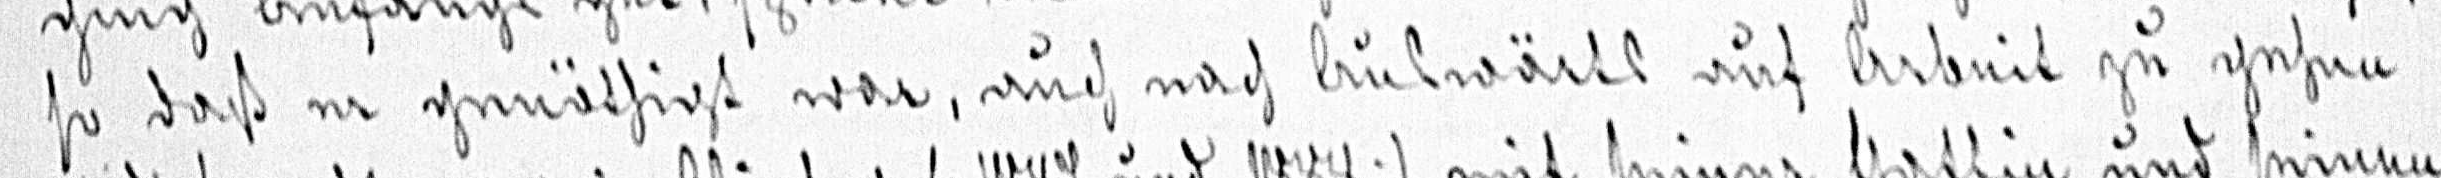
so daß er genöthigt war, auch nach Auswärts auf Arbeit zu gehen
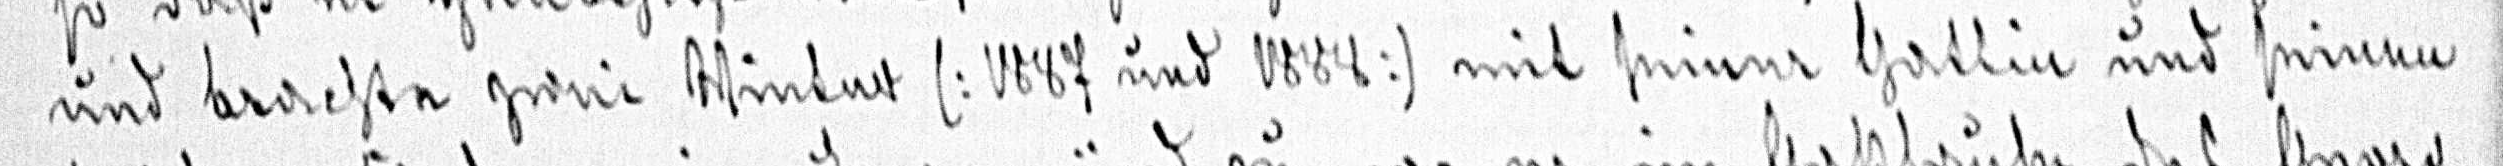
und brachte zwei Winter (1887 und 1888) mit seiner Gattin und seinem
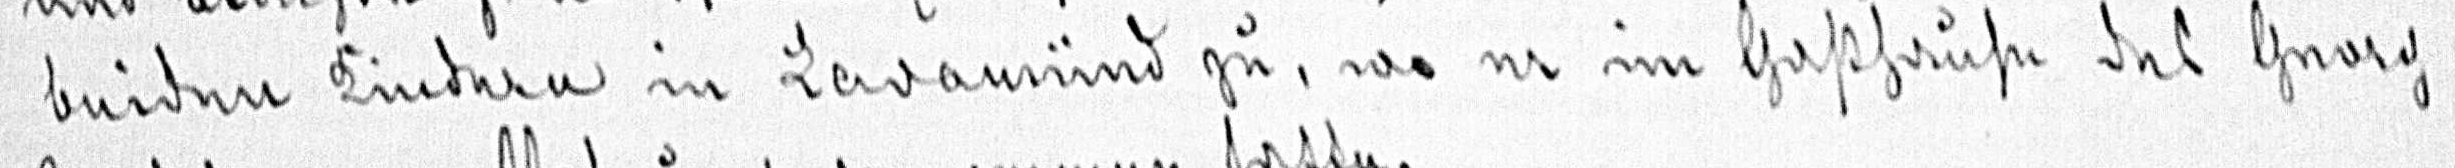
beiden Kindern in Lavamünd zu, wo er in Gasthause des Georg
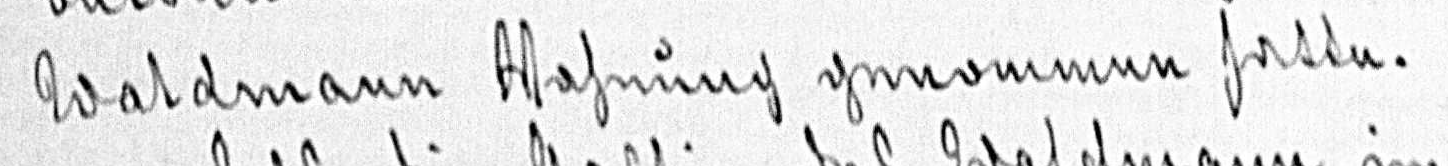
Waldmann Wohnung genommen hatte.
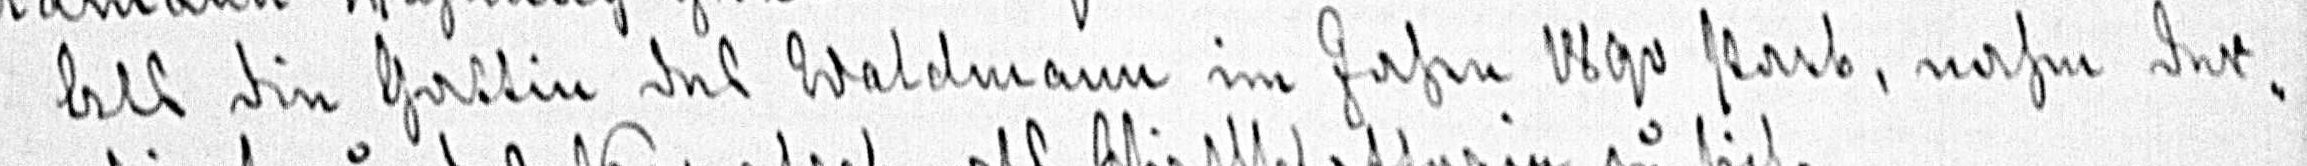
Als die Gattin des Waldmann im Jahre 1890 starb, nahm der¬
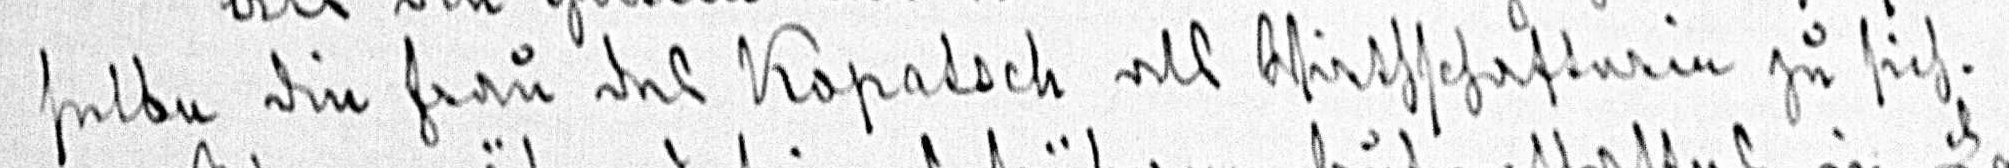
selbe die Frau des Kopatsch als Wirtschafterin zu sich.
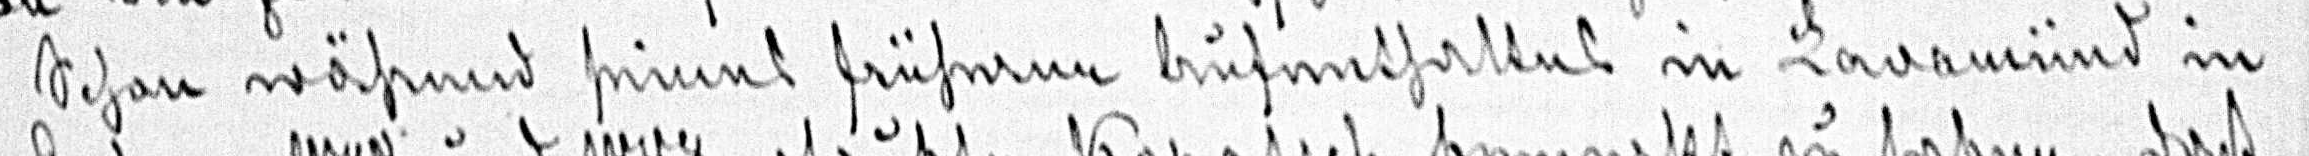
Schon während seines früheren Aufenthaltes in Lavamünd in
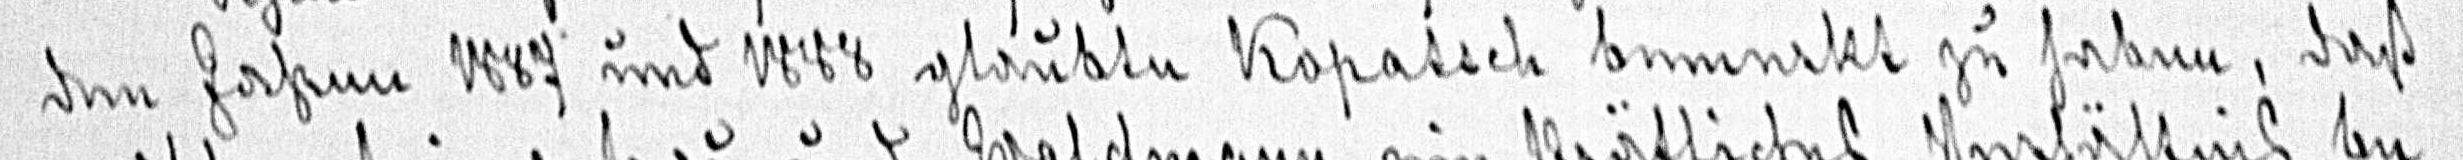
den Jahren 1887 und 1888 glabute Kopatsch bemerkt zu haben, daß
